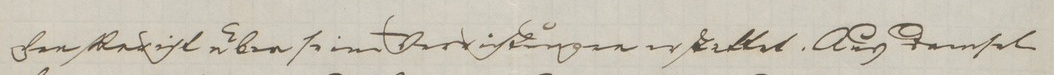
chen Bericht über seine Verrichtungen erstattet. Aus demsel-
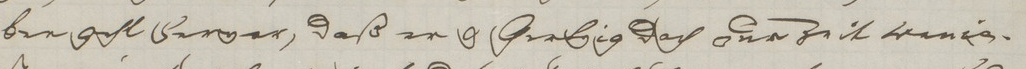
ben geht hervor, daß er & Gerwig doch zur Zeit wenig-
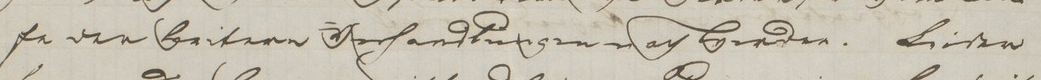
fe der weitern Verhandlungen noch werden. Leider
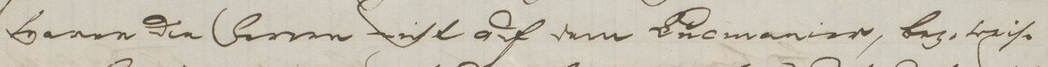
waren die Herren nicht auf dem Lucmanier, bez.weise
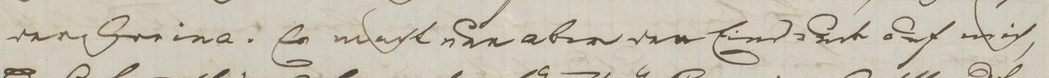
der Greina. Es macht nun aber den Eindruck auf mich,
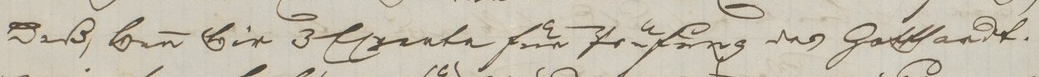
daß, wenn wir 3 Experte für Prüfung des Gotthardt -
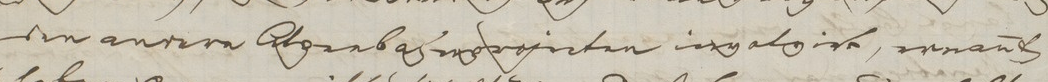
den andern Alpenbahnprojecten involvirt, ernannt
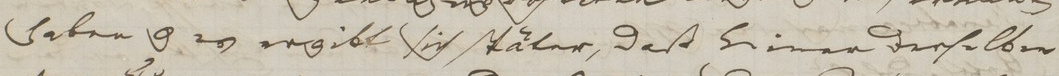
haben & es ergibt sich später, daß keiner derselben
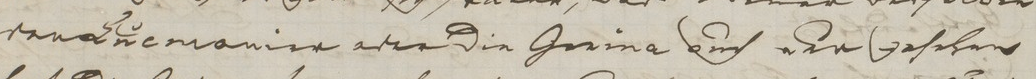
den Lucmanier oder die Greina auch nur gesehen
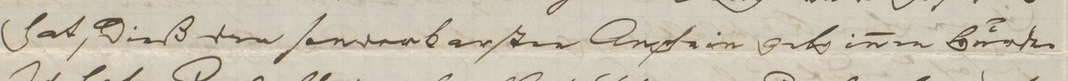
hat, dieß den sonderbarsten Anschein gewinnen würde.
